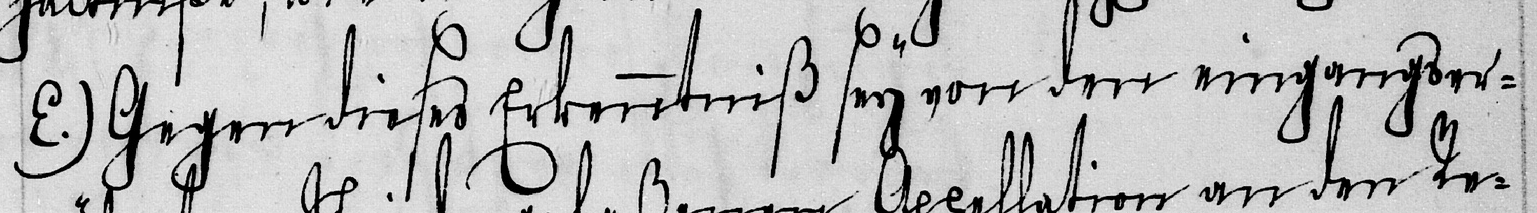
E.) Gegen diese Erkenntniß sey von den eingangser¬
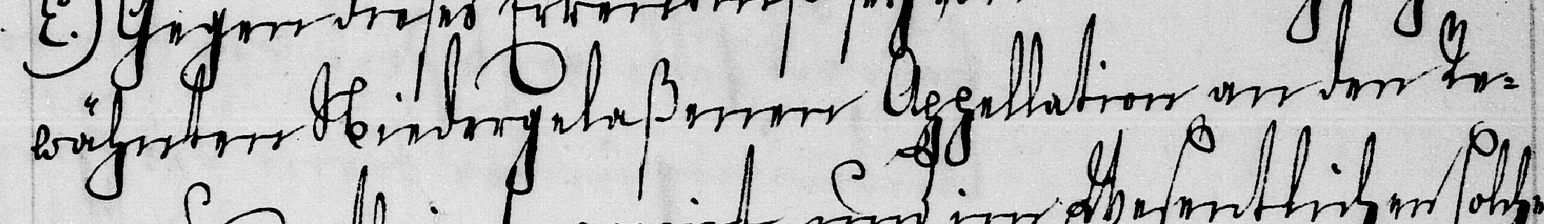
wähnten Niedergelaßenen Appellation an den Re¬
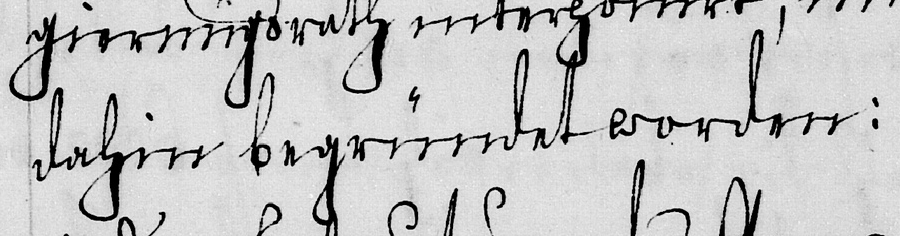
dahin begründet worden:
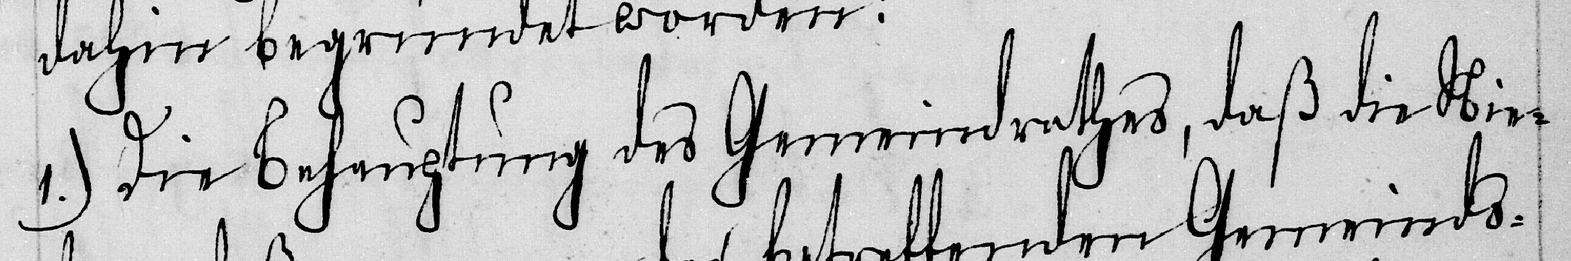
1.) Die Behauptung des Gemeindrathes, daß die Nie¬
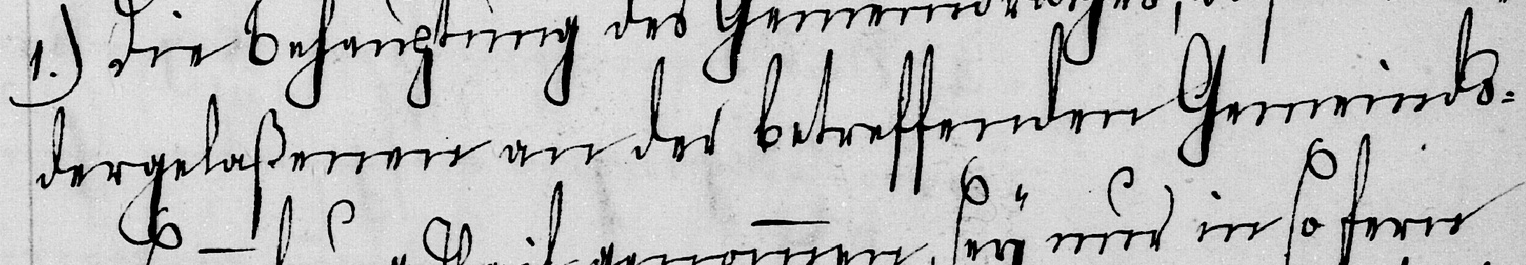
dergelaßenen an der betreffenden Gemeinds¬
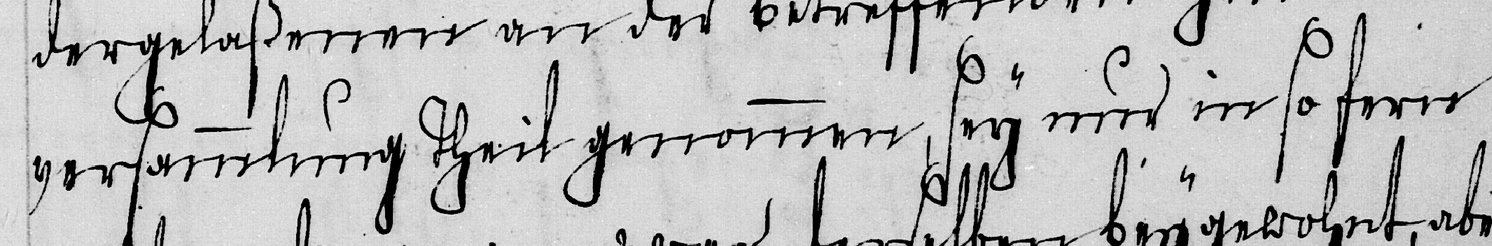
versammlung Theil genommen, sey nur in so fern
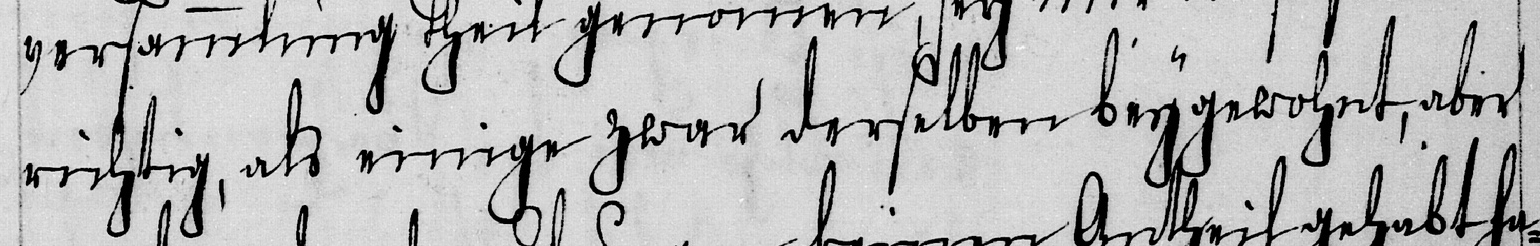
richtig, als einige zwar derselben beygewohnt, aber
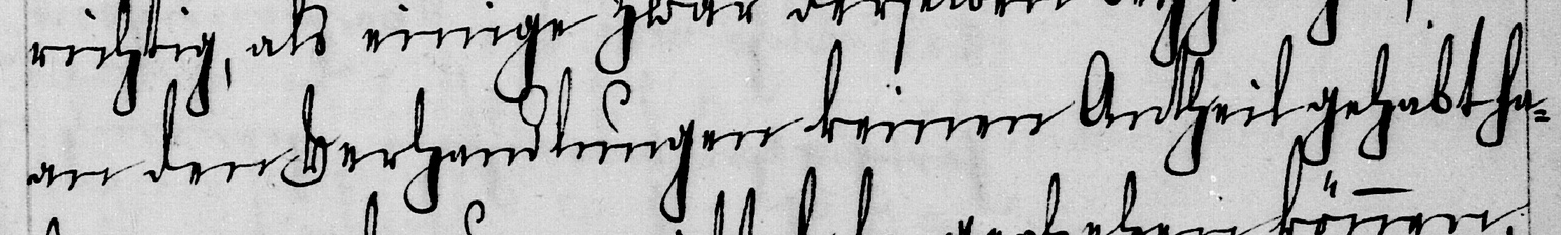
an den Verhandlungen keinen Antheil gehabt ha¬
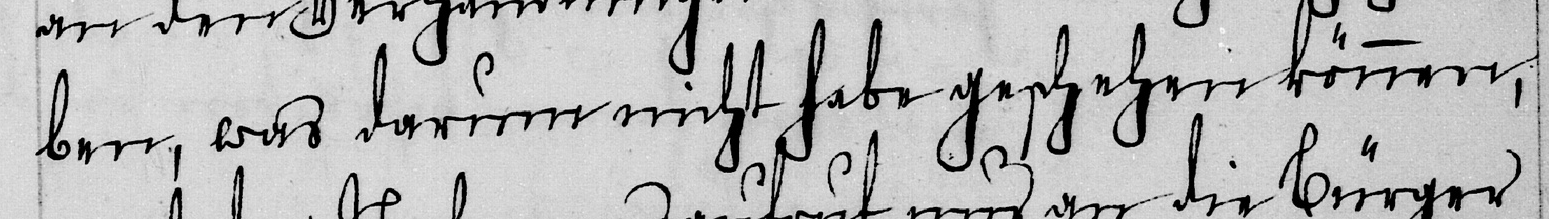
ben, was darum nicht habe geschehen können,
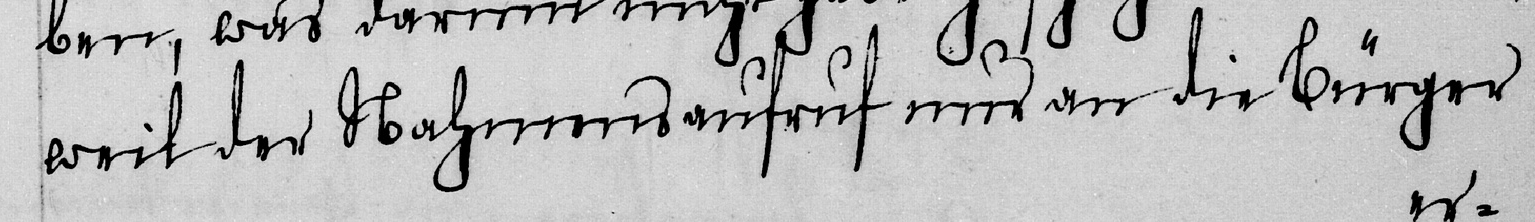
weil der Nahmensaufruf nur an die Bürger
